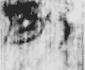所
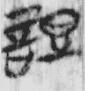○（屬）
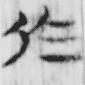於
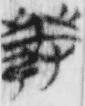○（發）
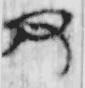尹
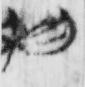利（利）
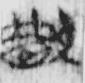荊（荆）
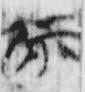𫵖
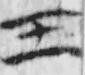壬
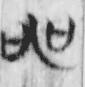申
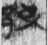○（鄢）
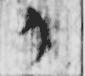人
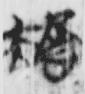○（胡）
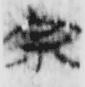余
